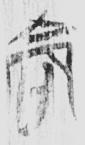命
